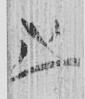之
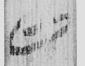㠯（以）
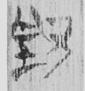型（刑）
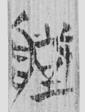○（贓）
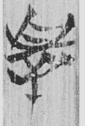辠（罪）
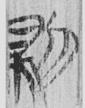則
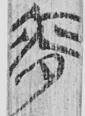夜（赦）
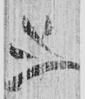之
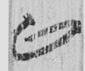㠯（以）
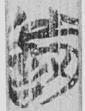罰
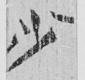少（小）
